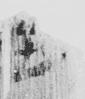田
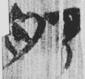肥
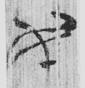民
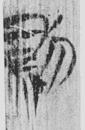則
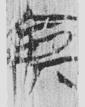安
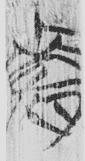○（瘠）
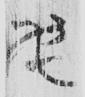民
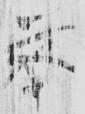不
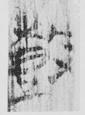鼓
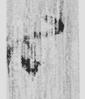氏（是）
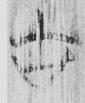古（故）
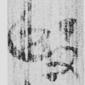臤（賢）
